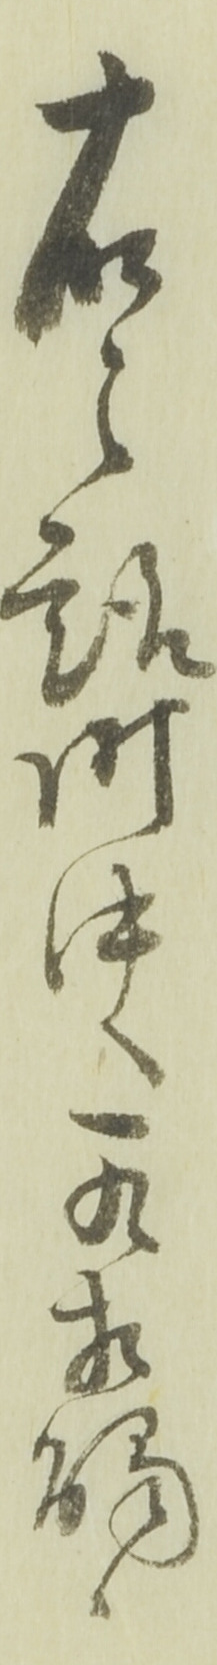右之趣町中へ可相触候

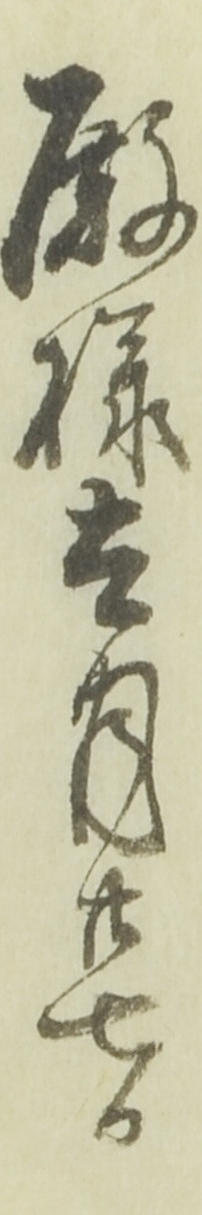殿様去月廿七日
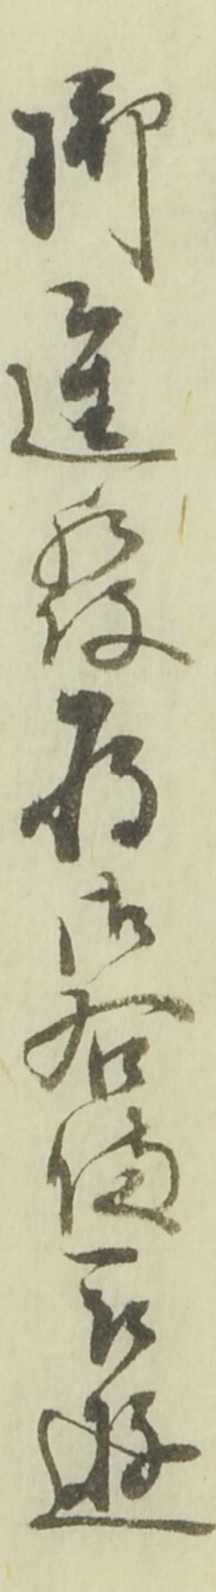御進発為御右備被遊
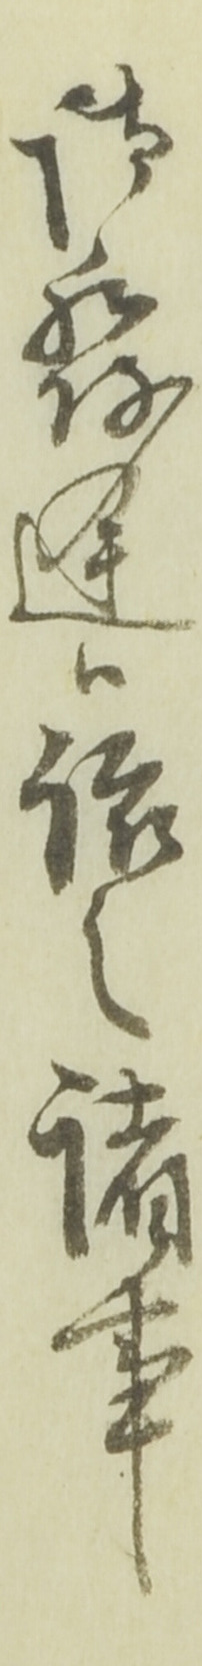御発途候依之諸事
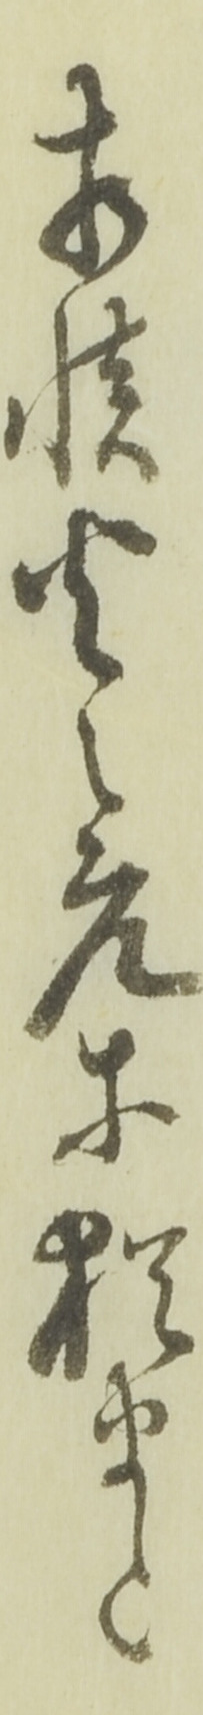相慎火之元猶また
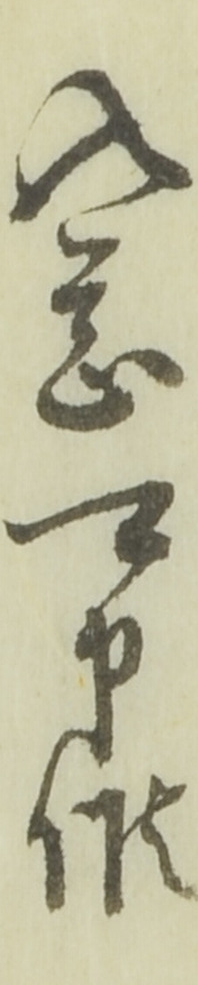入念可申候
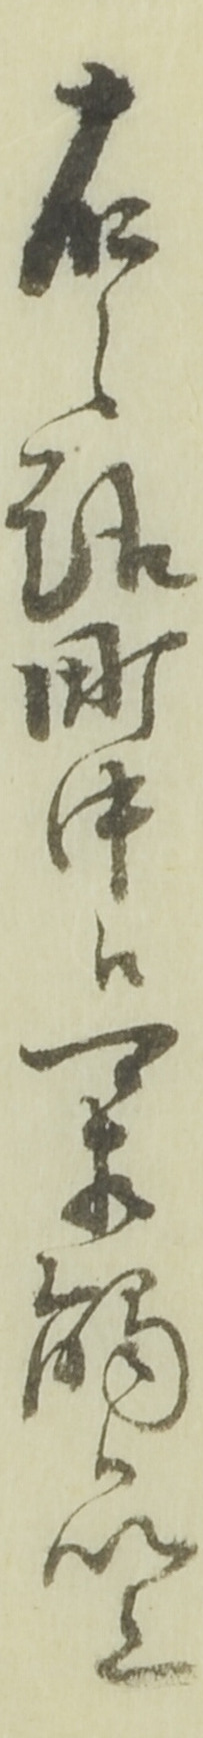右之趣町中江可相触候以上
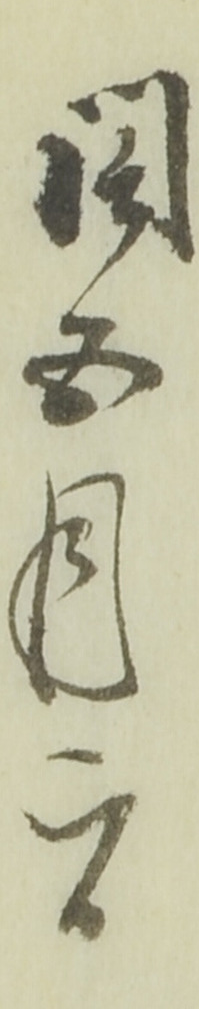閏五月二日
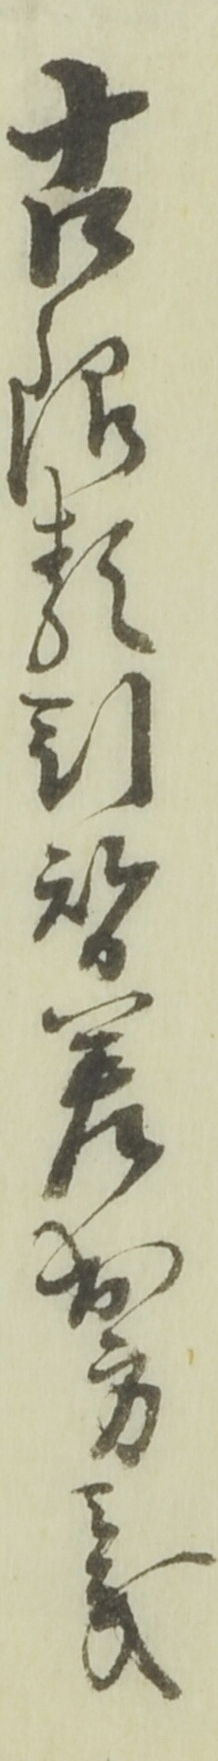古銀類引替差出方之義
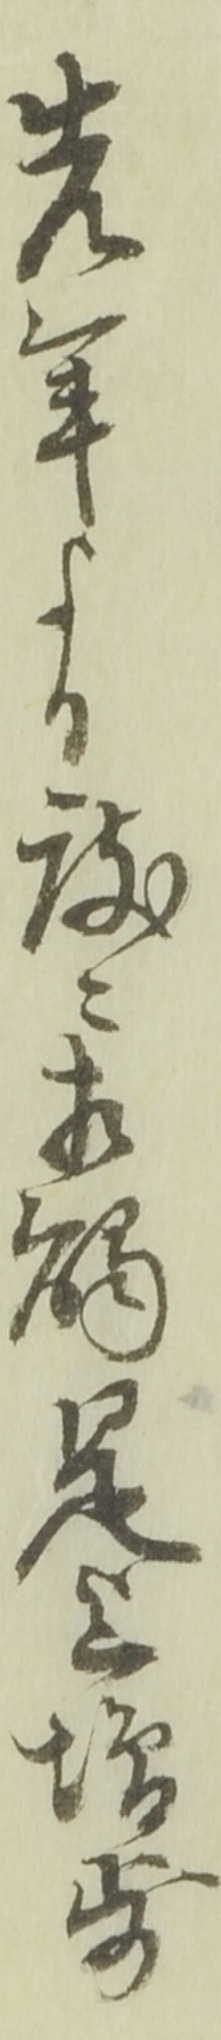先年より度々相触是迄増歩
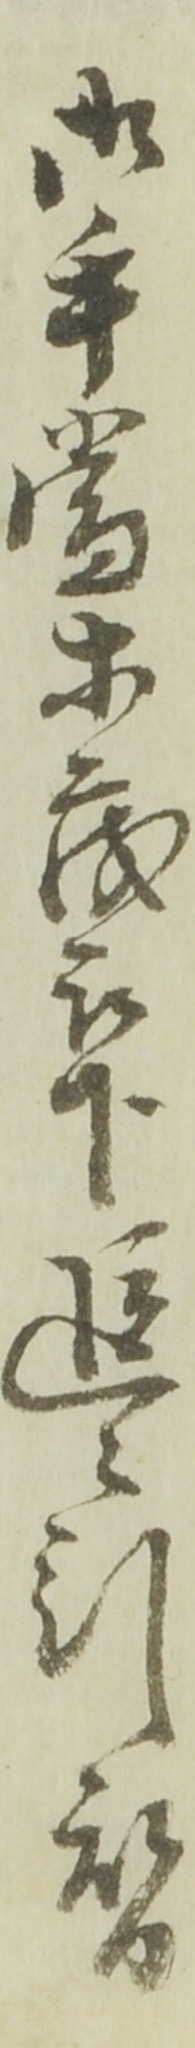御手当等茂被下追々引替
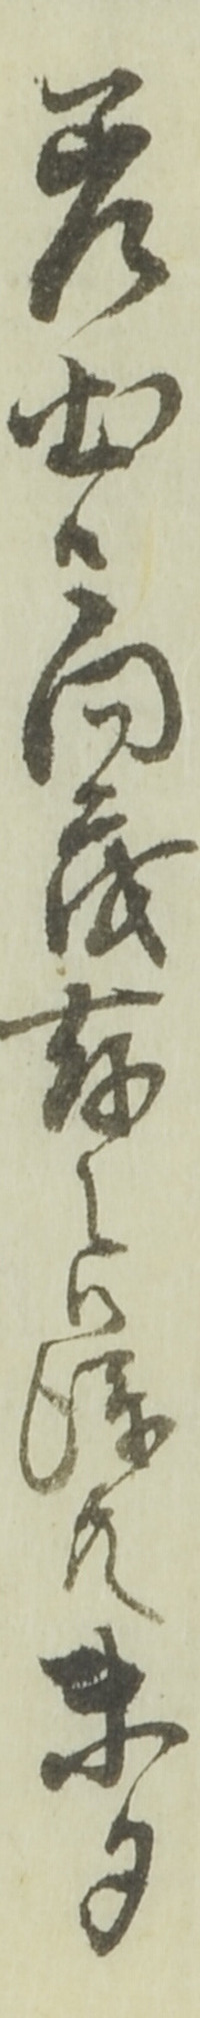差出候向茂存之候得共未タ
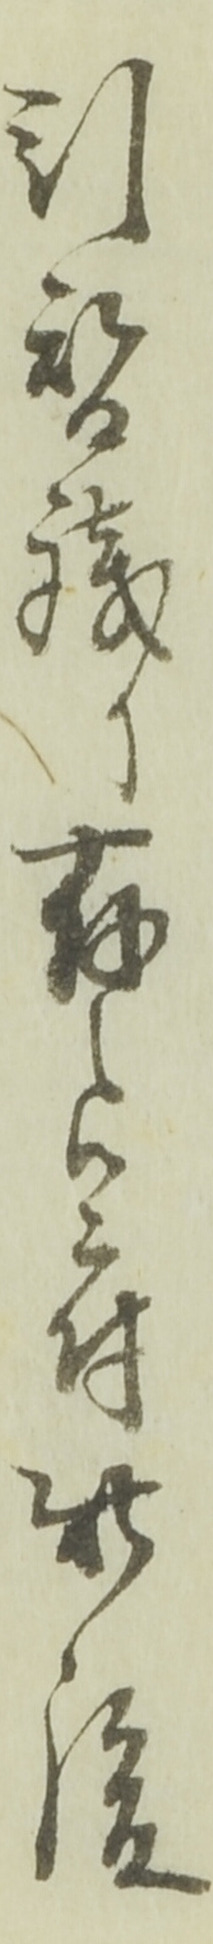引替残り存之候ニ付此後
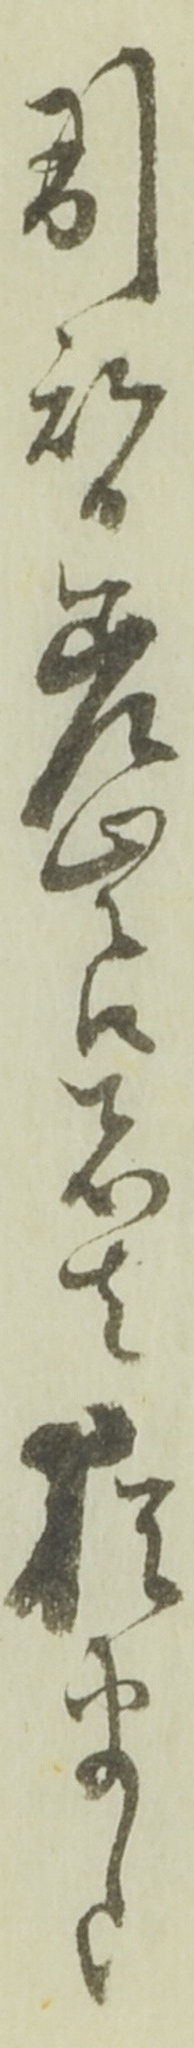引替差出候者者猶また
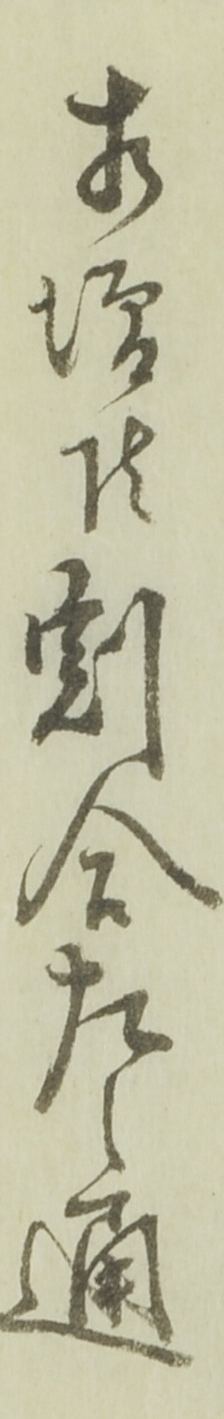相増候割合左之通
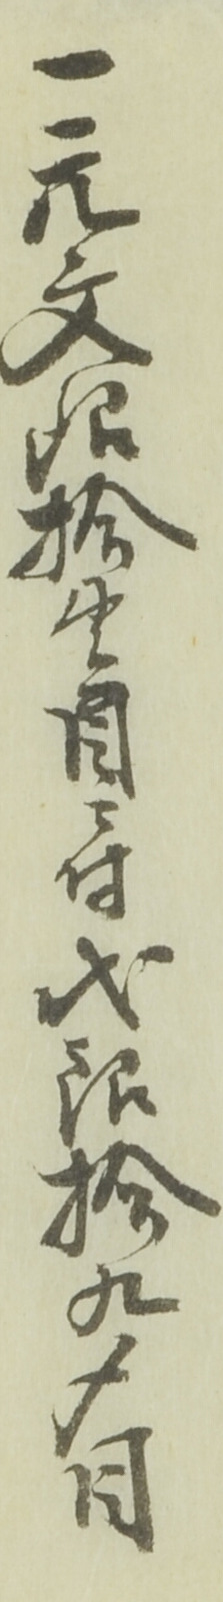一元文銀拾貫目ニ付代銀拾九〆目
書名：御触書御書附控帳
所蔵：伊那市立高遠町図書館・合同会社AMANE
